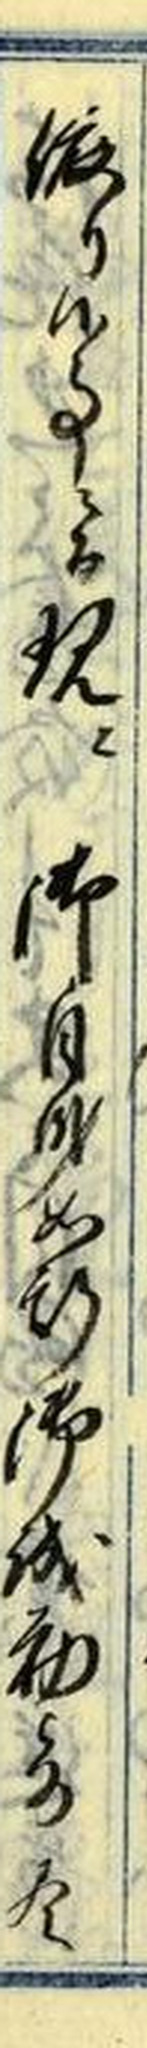依り候事ニ而現ニ御自身如斯御誠勤被為尽
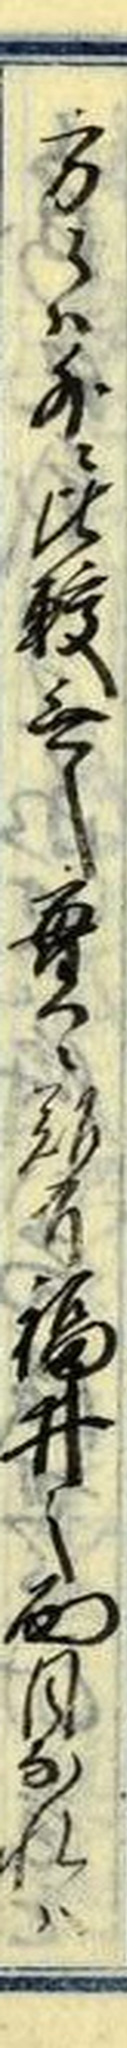方々ハ外ニ比較無之実ニ難有福井之面目なれハ
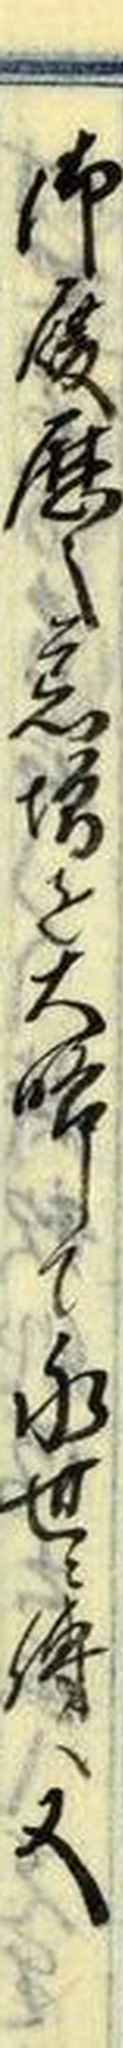御履歴之荒増を大略して永世ニ伝へ又
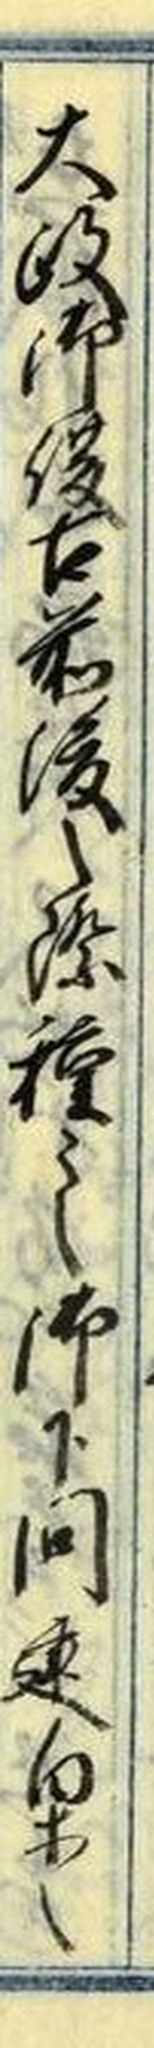大政御復古前後之際種々之御下問建白等之
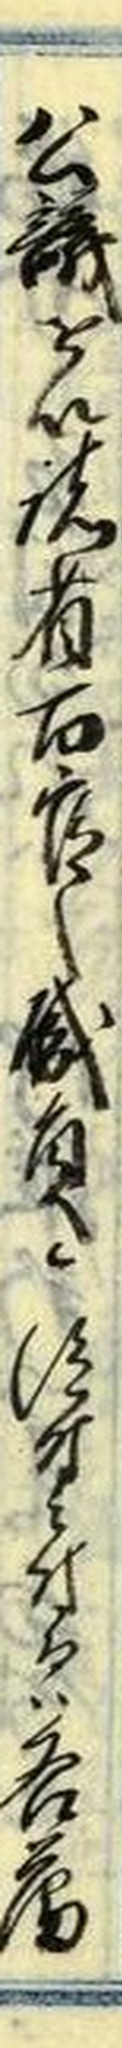公儀を以諸省百官之職員被仰付ニ付而ハ各藩
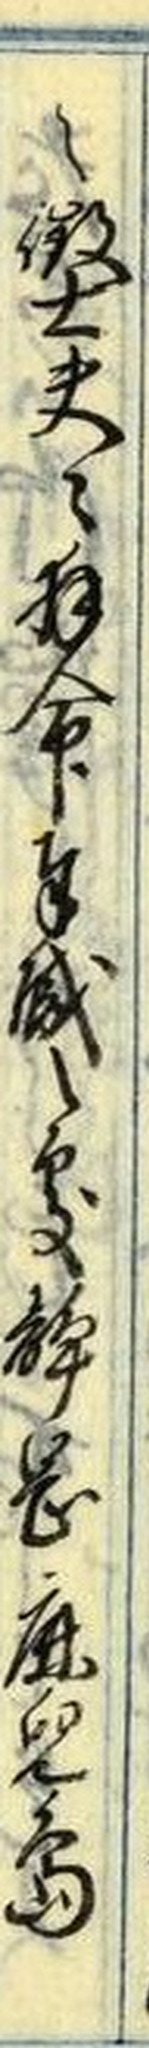之徴士夫々拝命奉職之処静岡鹿児島
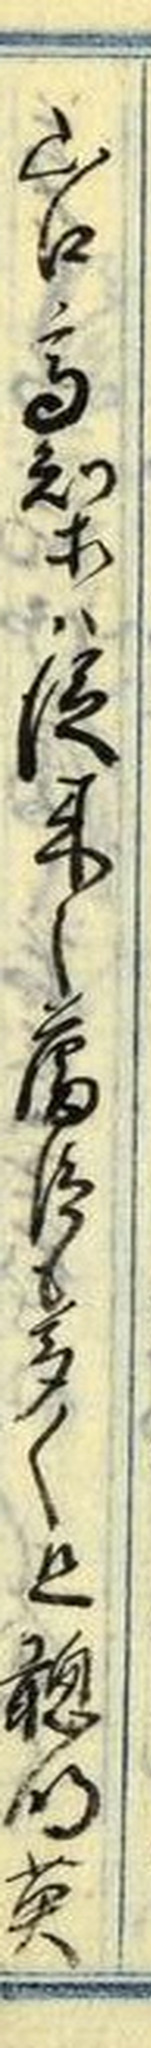山口高知等ハ従来之藩臣も多く且聡明英
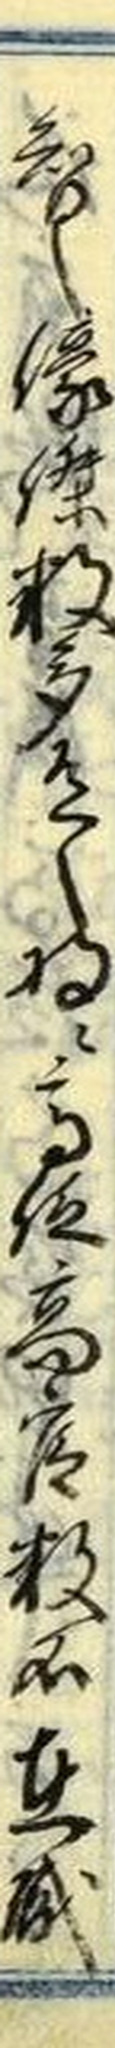智之儫傑数多有之将ニ高位高官数名在職
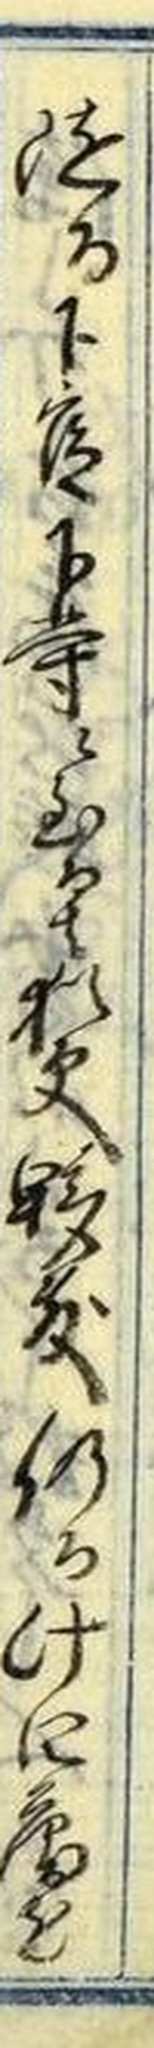随而下官下等ニ至而ハ猶更夥敷仍而此四藩を

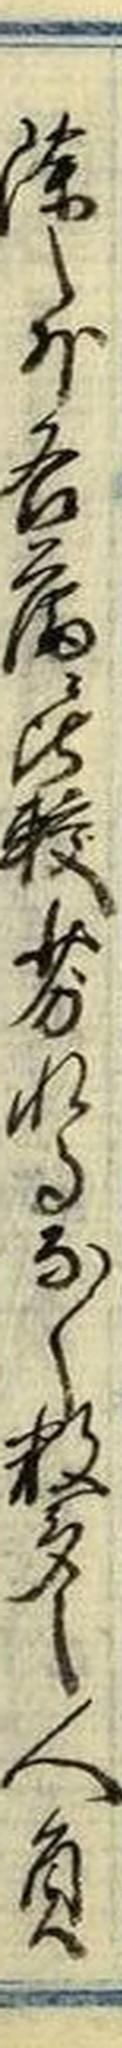除之外各藩ニ比較劣れるなく数多之人員
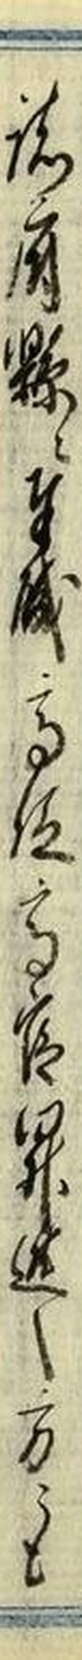諸府県ニ奉職高位高官昇進之方ニも
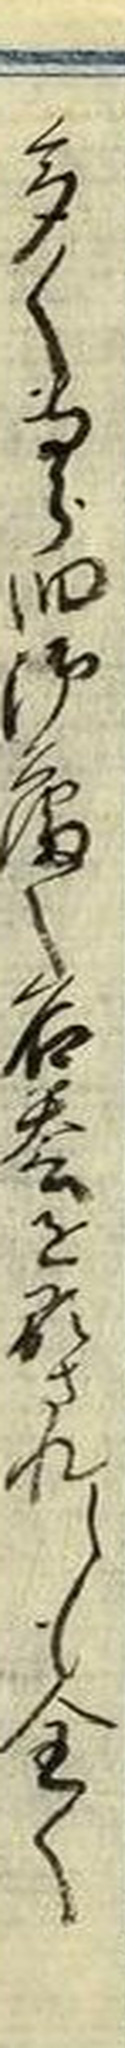多く専ら旧御藩之名誉を顕されしも全く
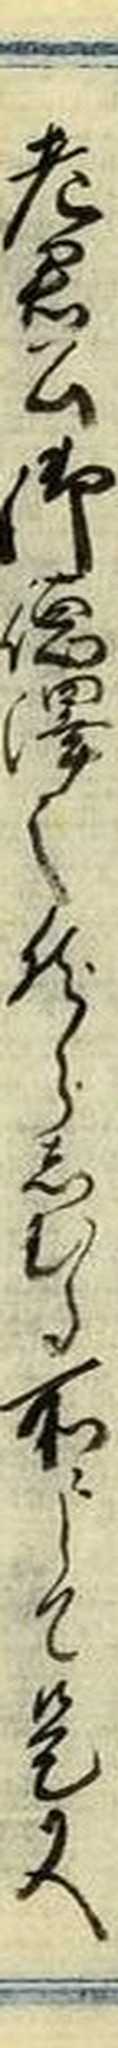老君公御徳沢之然らしむる所ニして是又
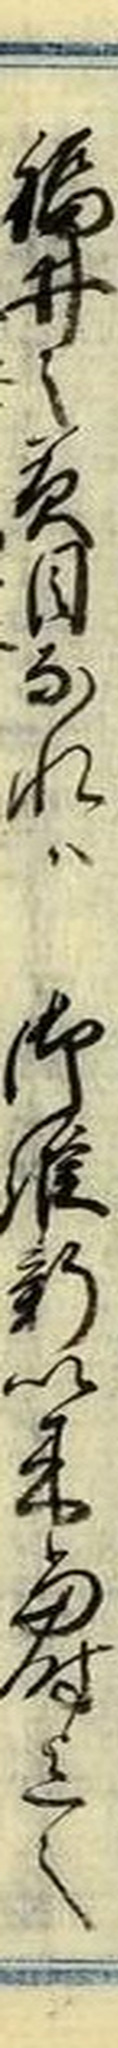福井之美目なれハ御維新以来当時迄之
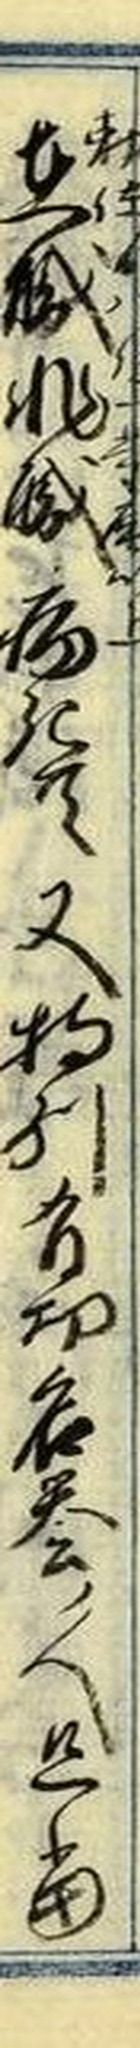在職非職病死共又特別有功名誉ノ人且当
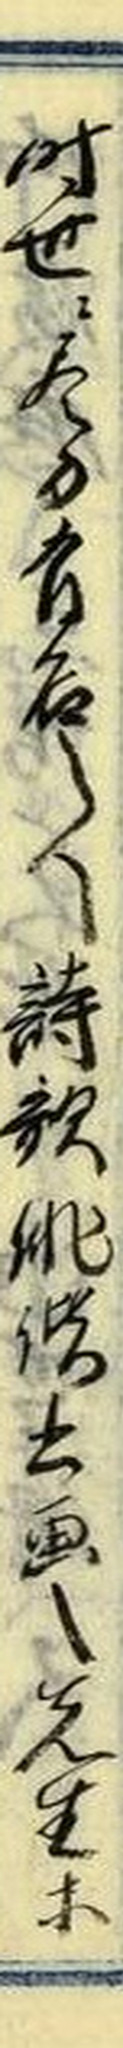時世ニ尽力有名之人詩歌俳諧書画之先生等
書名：温古集 三巻
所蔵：福井県文書館 Fukui Prefectural Archives
